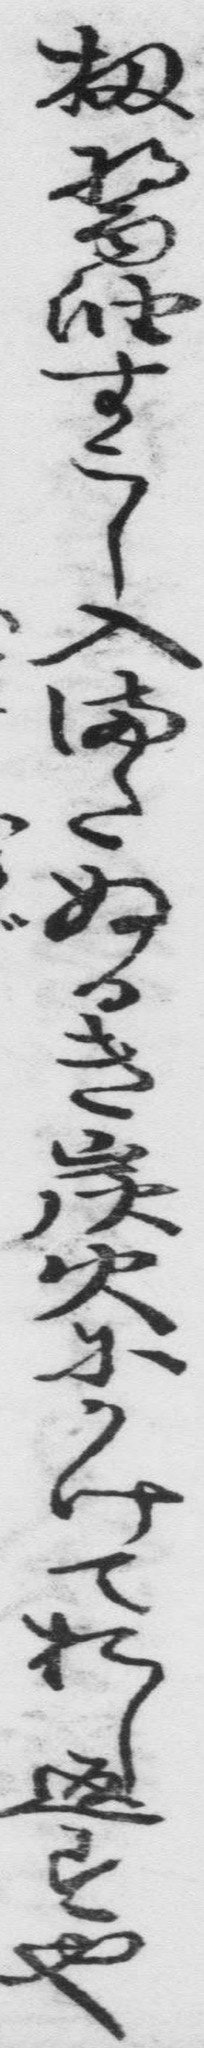扨醤油すこし入満たぬるき炭火尓かけて於し返春也
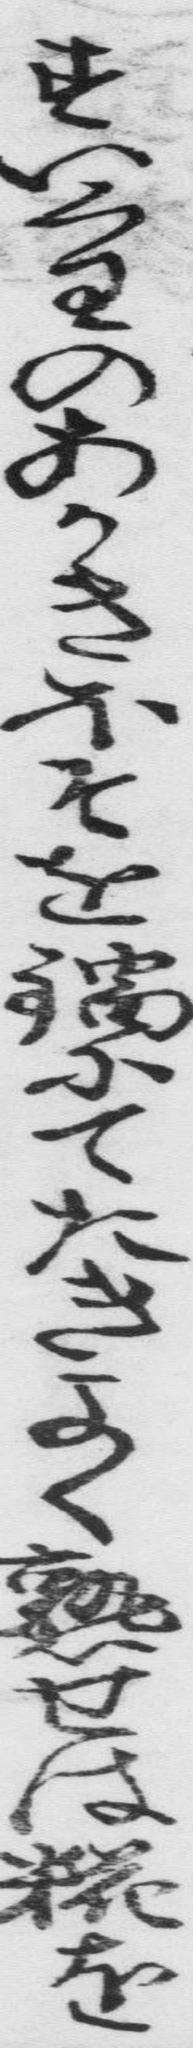春いくわのあかき不そを鍋尓てたきよく熟せは糀を
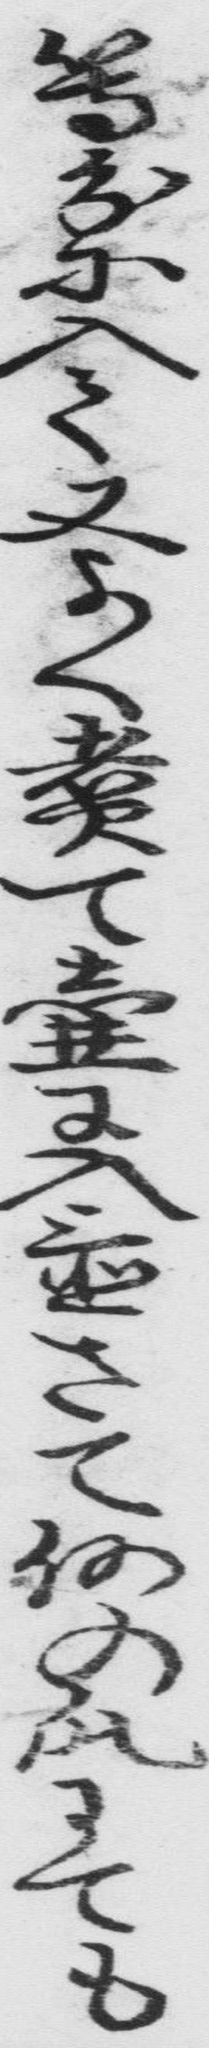等分尓入て又よく煮て壺尓入置さて何の瓜尓ても
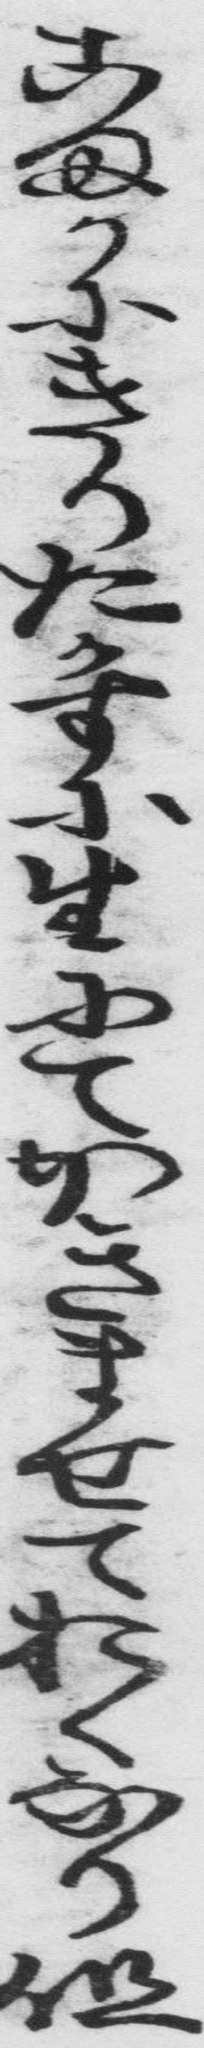古まか尓きりたかす尓生尓てかきませて於くなり但
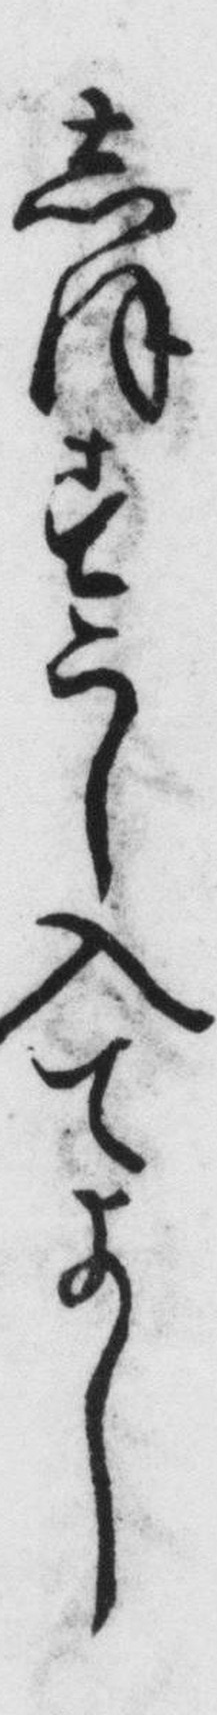志ほ春こし入てよし
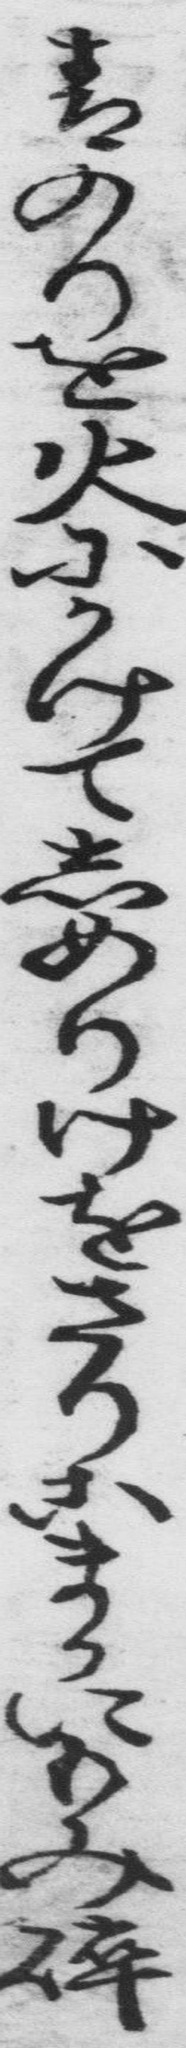青のりを火尓かけて志めりけをさり古まかにもみ碎
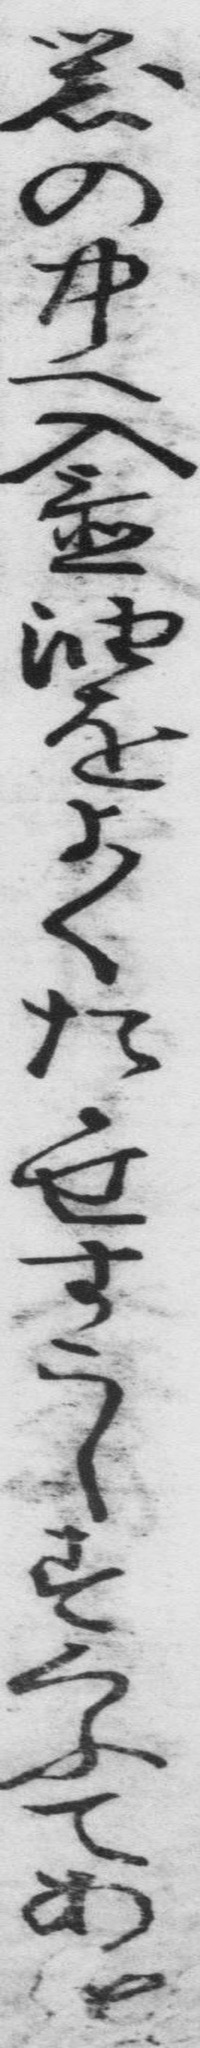器の中へ入置油をよくたゝせすこし春くふてあを

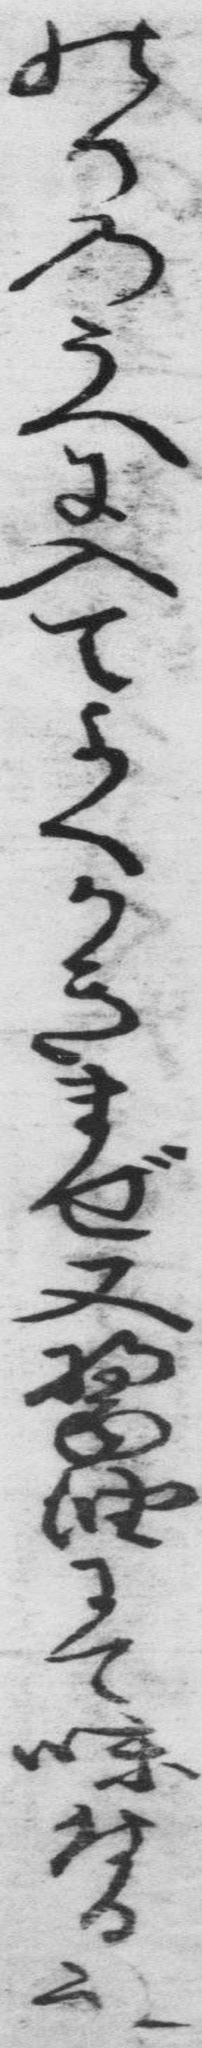能り乃うへ尓入てよくかきまぜ又醤油尓て味付る也
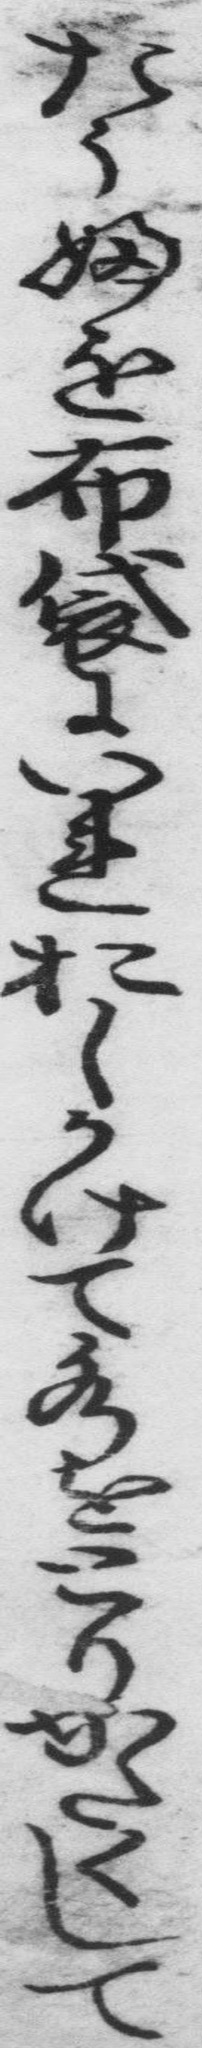たう婦を布袋尓い連於しかけて水をとりかたくして
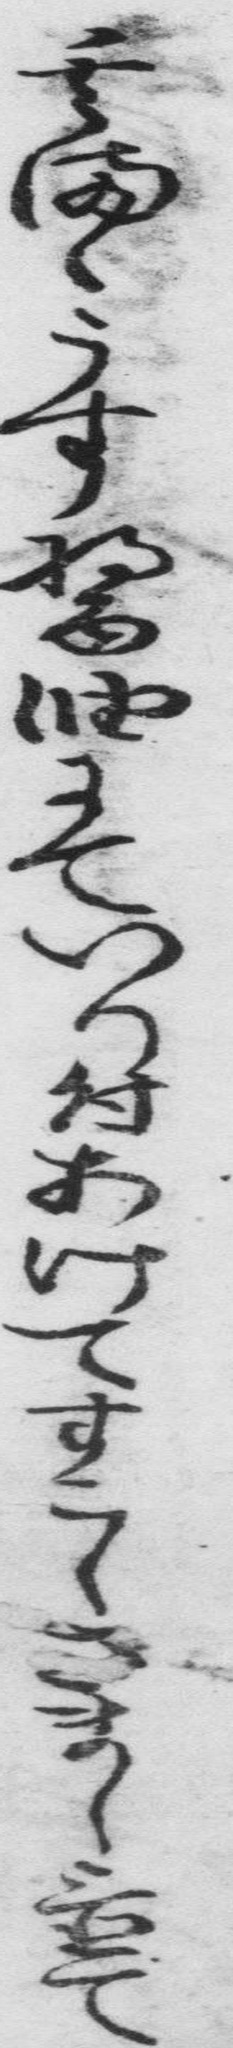其満々うす醤油尓ていり付あけてすこしさまし置て
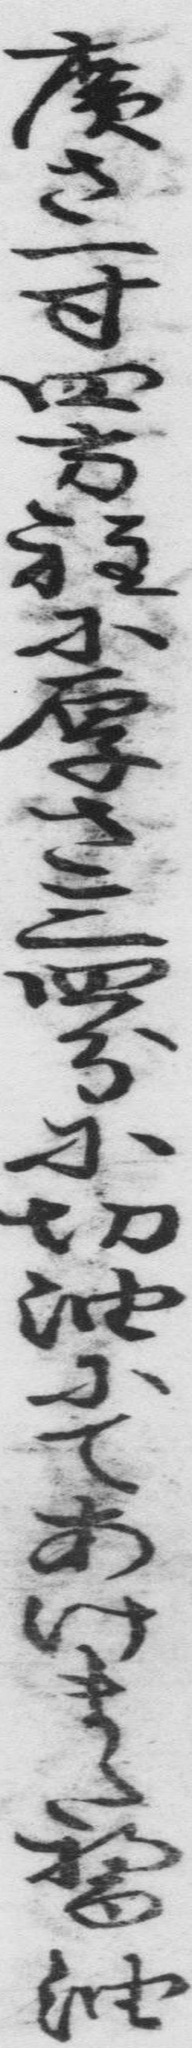廣さ一寸四方程尓厚さ三四分尓切油尓てあけまた醤油
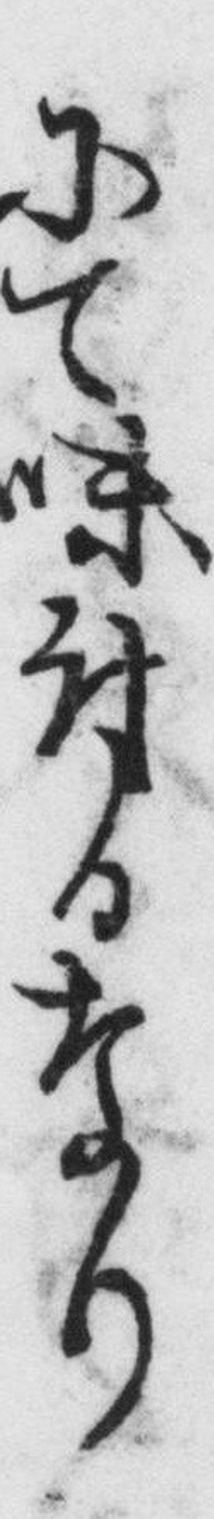尓て味付なり
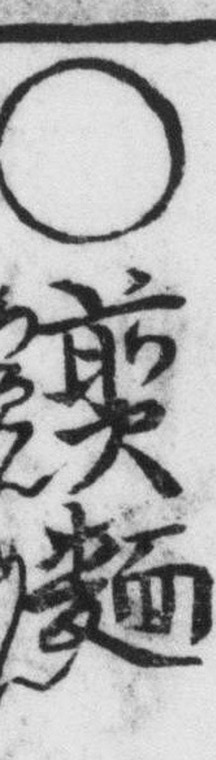〇煎麺
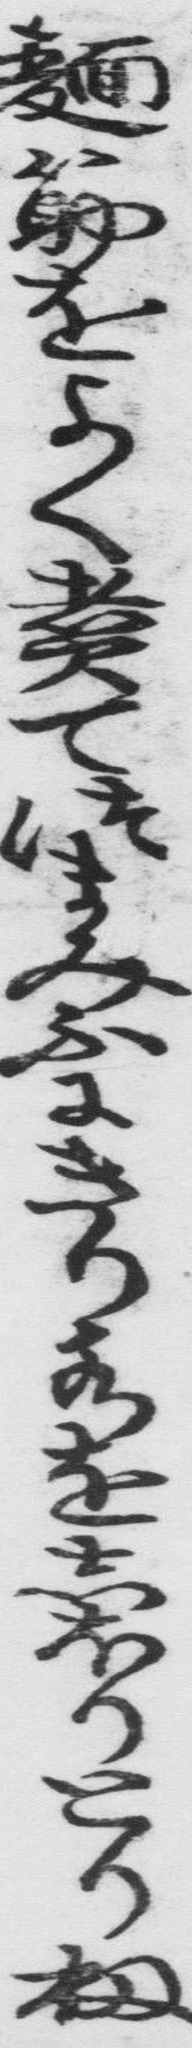麺筋をよく煮て徒まみふ尓きり水を志不りとり扨
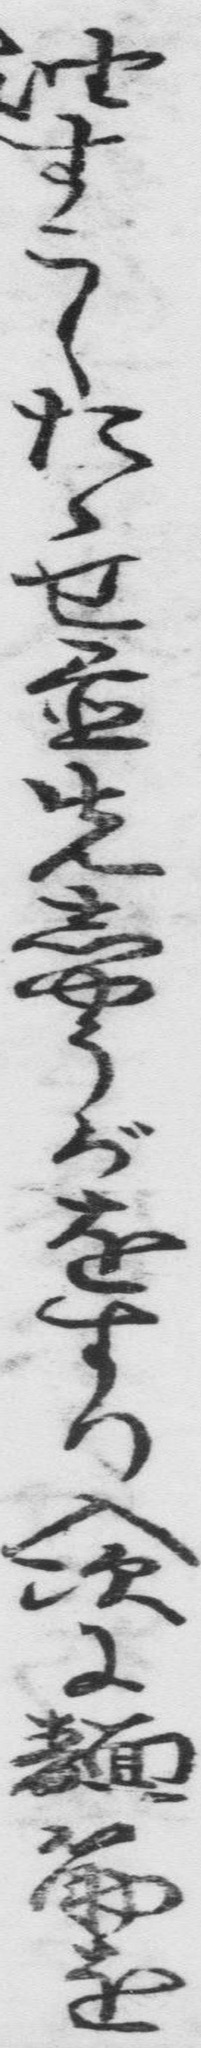油すこしたゝせ置先志やうがをすり入次尓麺筋を
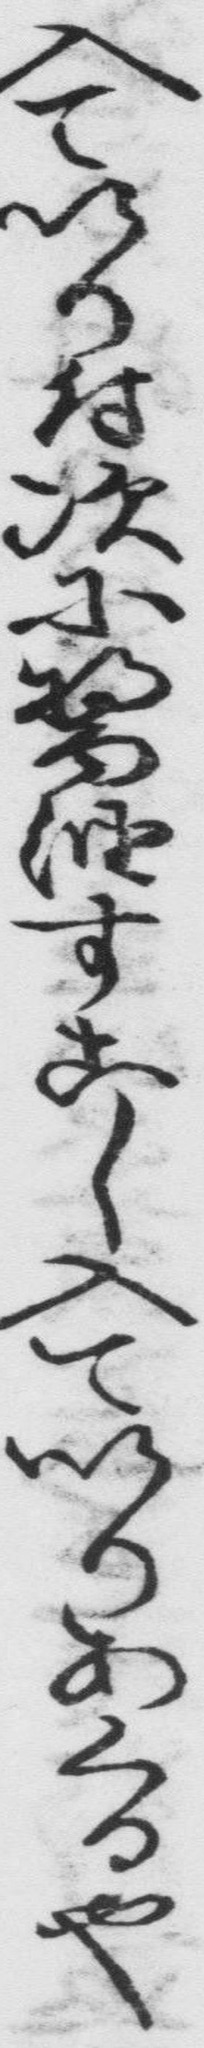入て以り付次尓醤油す古し入て以りあくる也
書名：普茶料理抄
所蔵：大阪府立大学学術情報センター 国文学研究資料館
